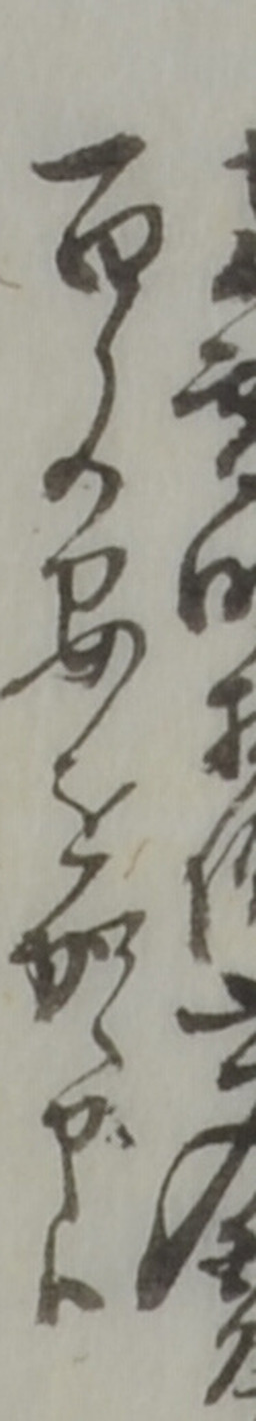百文品を加へ申候
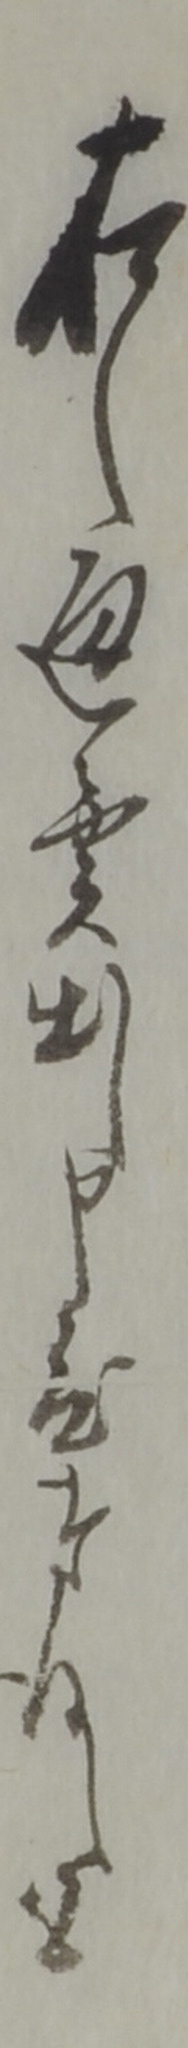右之通売出申度奉存候以上
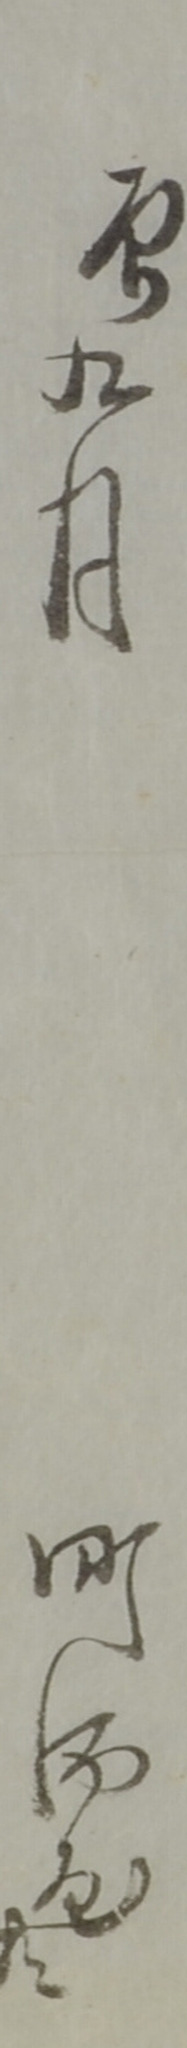辰九月町酒屋共
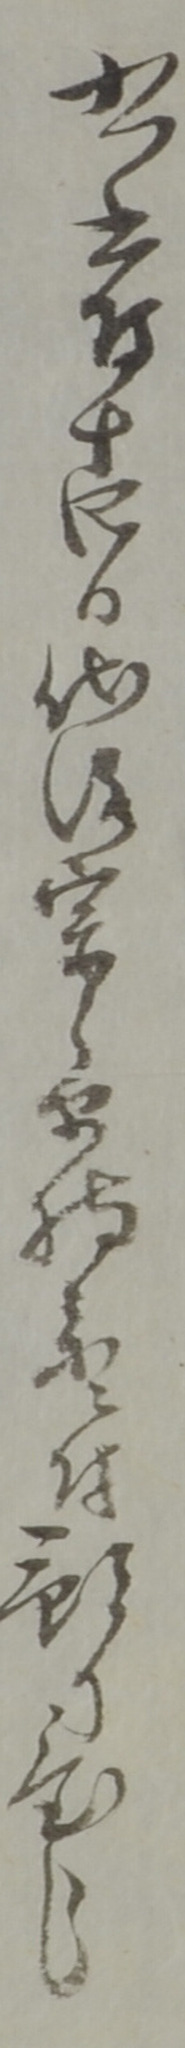右書付十四日代儀宋兵衛持参ニ付預置候
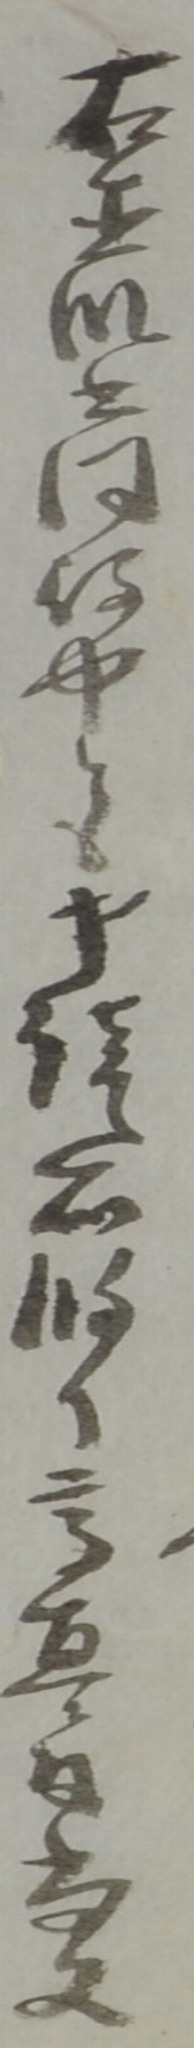右直御書同役中とも申請候所段々高値ニ付尚又
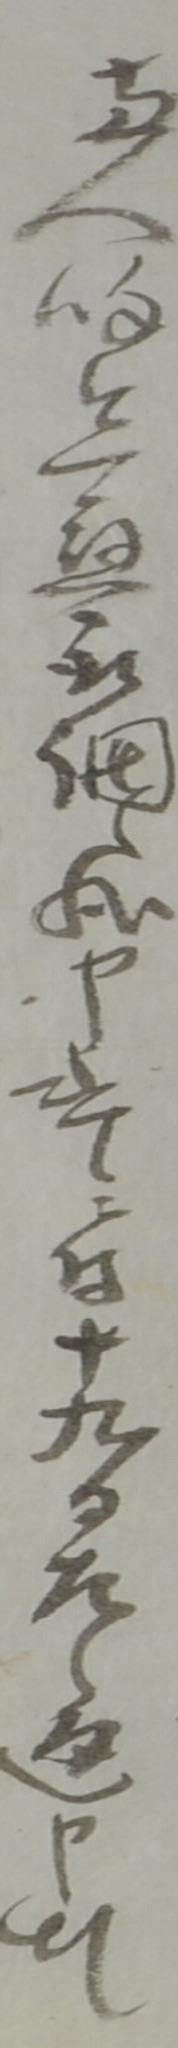両人呼と一応被調候様申出候ニ付十九日右之通申出候
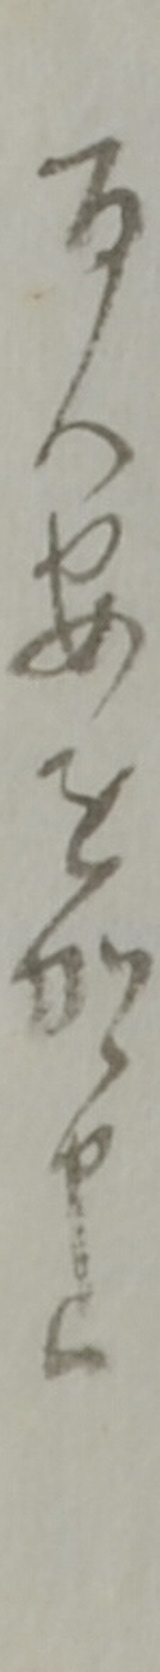百文品を加へ申候

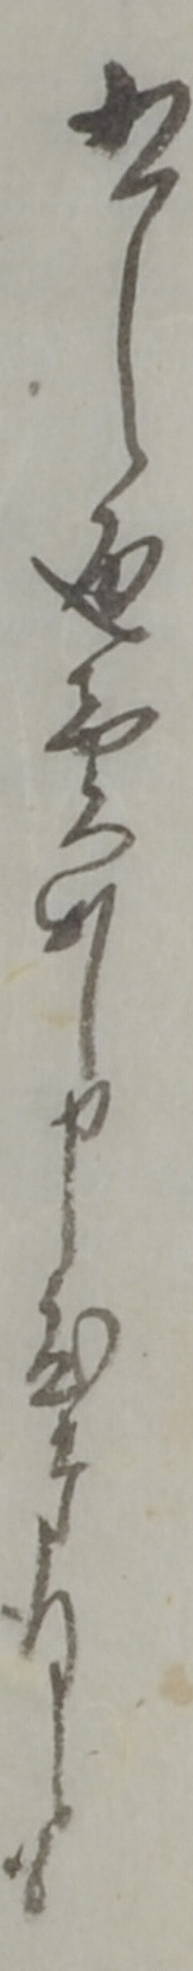右之通売出申度奉存候以上
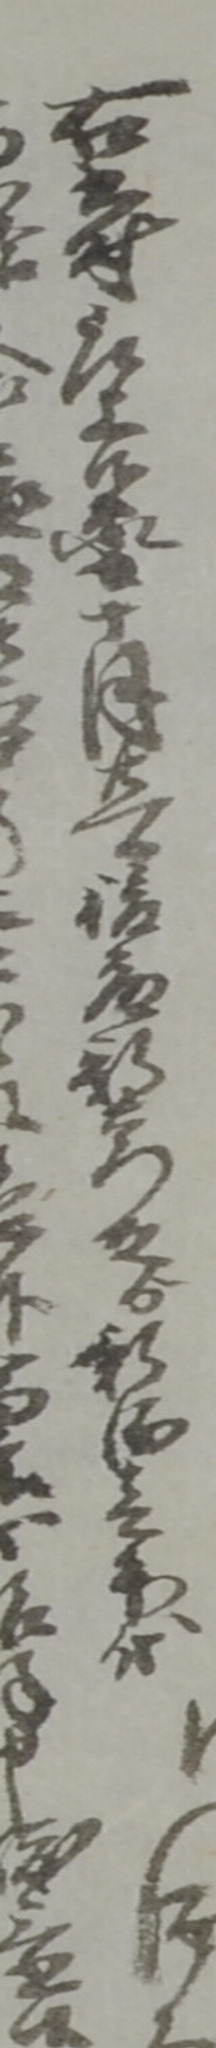右書付差上候処ニ付十月廿一日後藤新右衛門殿ゟ新酒壱本代
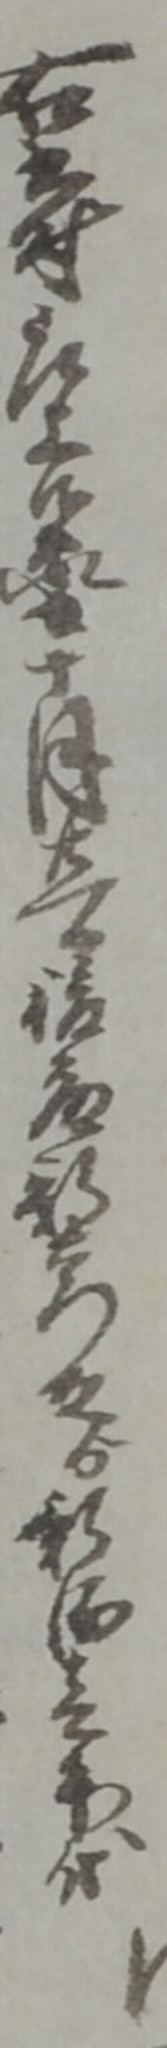右書付差上候処ニ付十月廿一日後藤新右衛門殿ゟ新酒壱本代
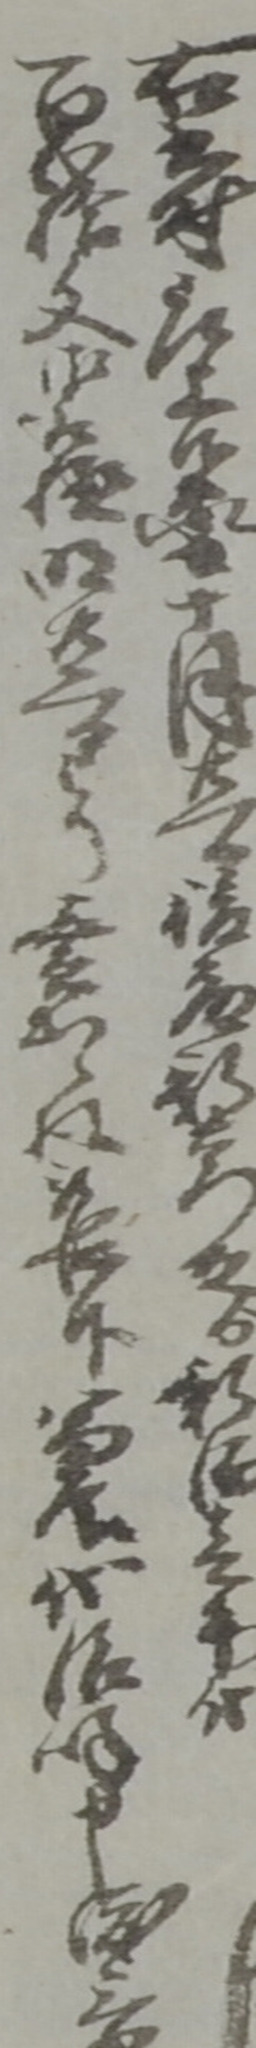百弐拾文御取極明廿ニ日より売出候様被出下付当辰代治呼申渡
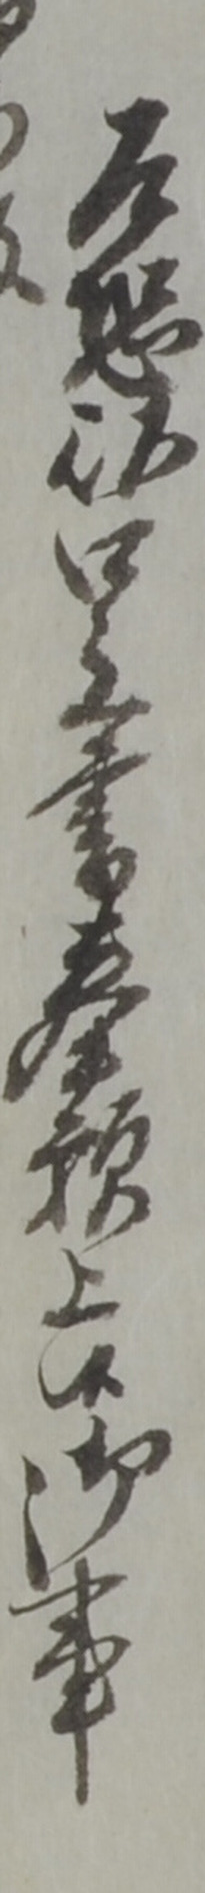乍恐以口上書奉願上候御事
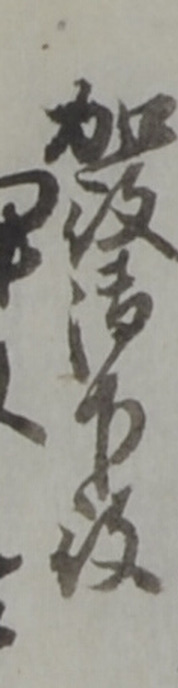加役御下役
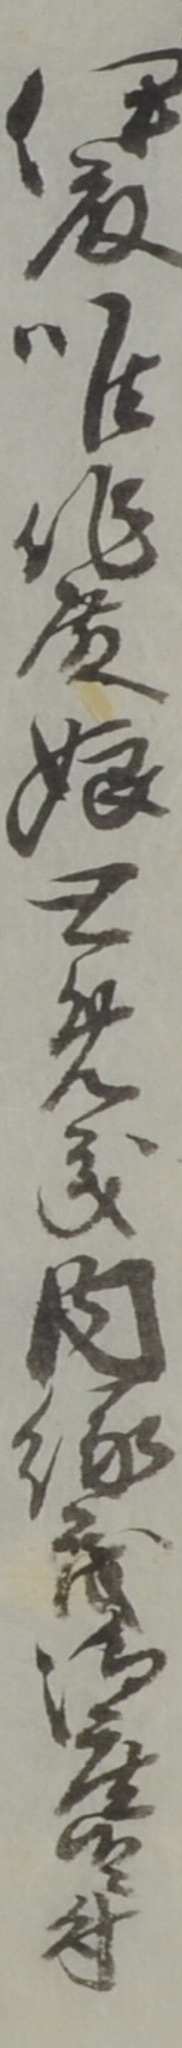伊藤唯作殿娘とめ義内縁も御座候ニ付
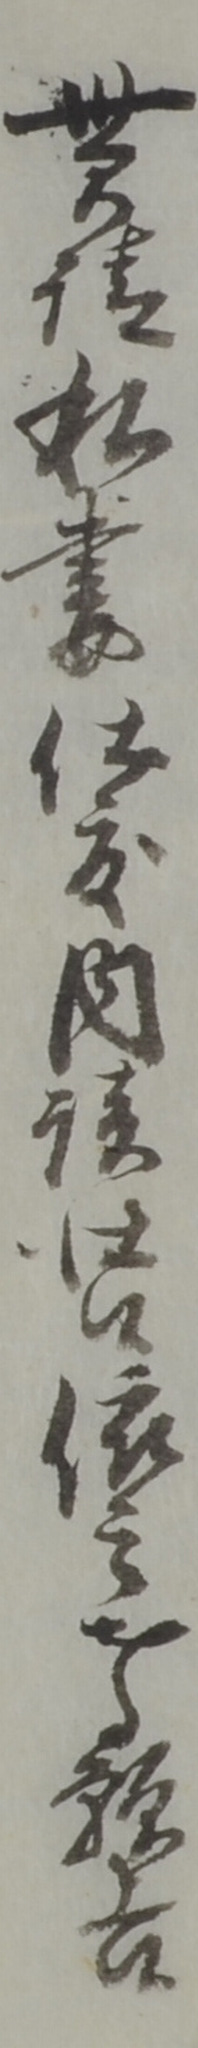貰請私妻仕度内談仕候依之奉願上候
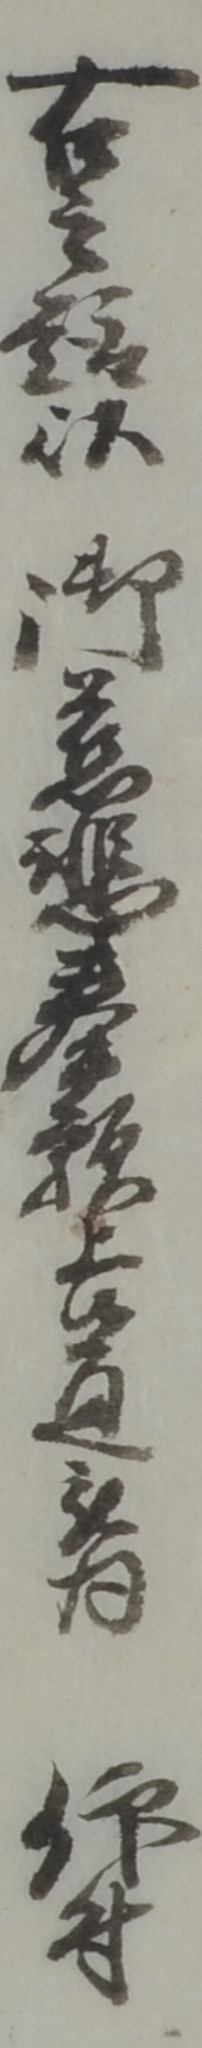右之趣以御慈悲奉願上候通被為仰付
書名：諸願書控簿
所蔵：伊那市立高遠町図書館・合同会社AMANE
